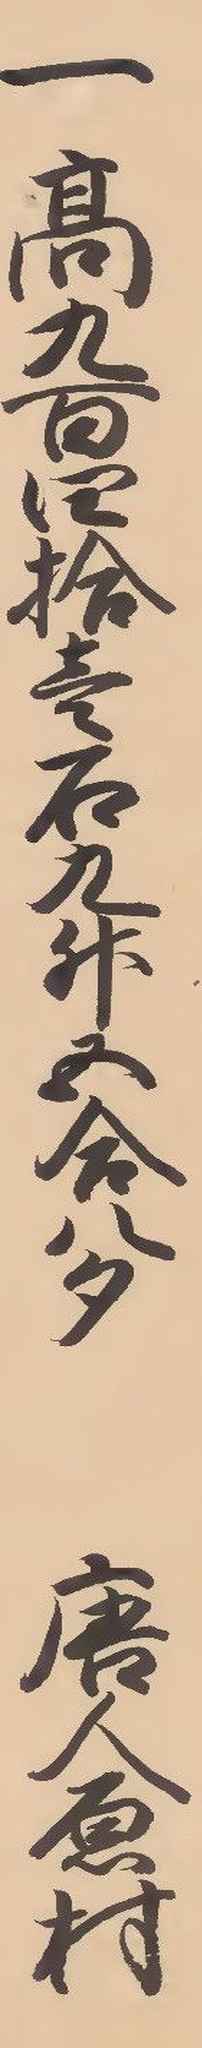一高九百四拾壱石九升五合八勺唐人原村
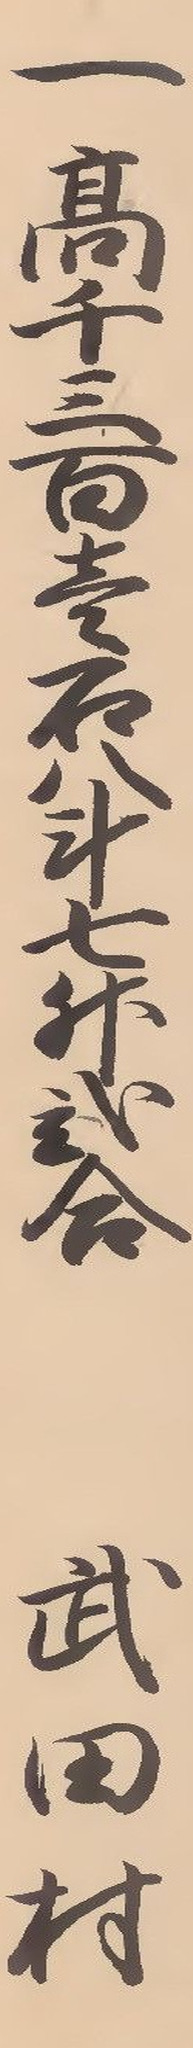一高千三百壱石八斗七升弐合武田村
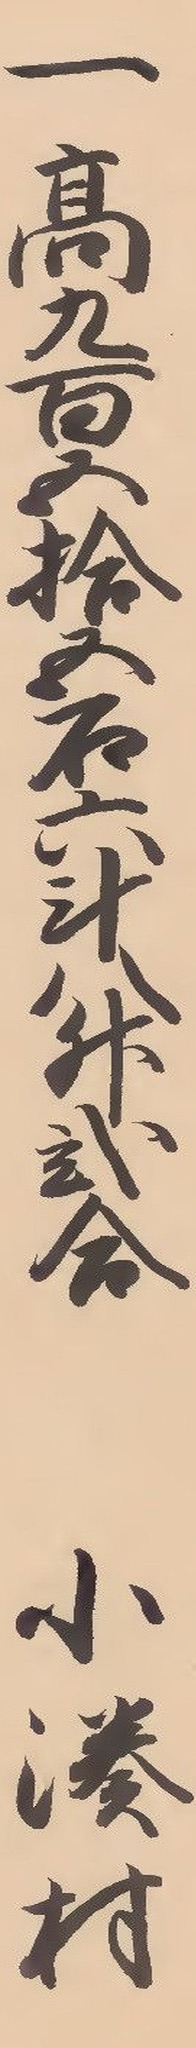一高九百五拾五石六斗八升弐合小湊村
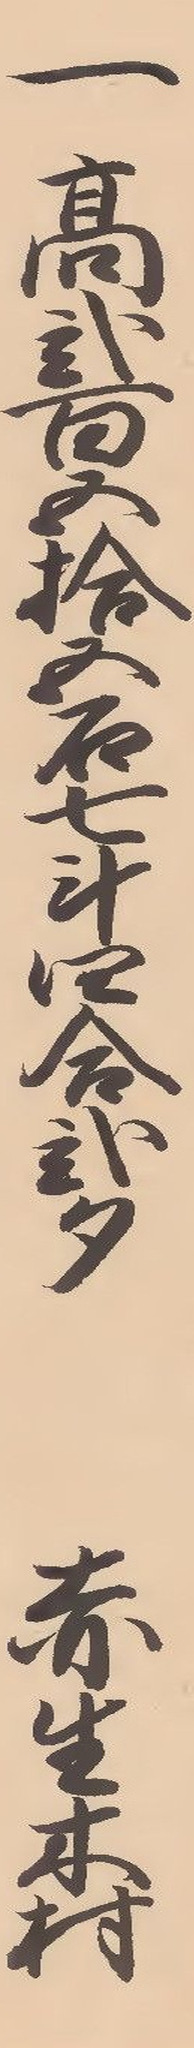一高弐百五拾五石七斗四合弐勺赤生木村
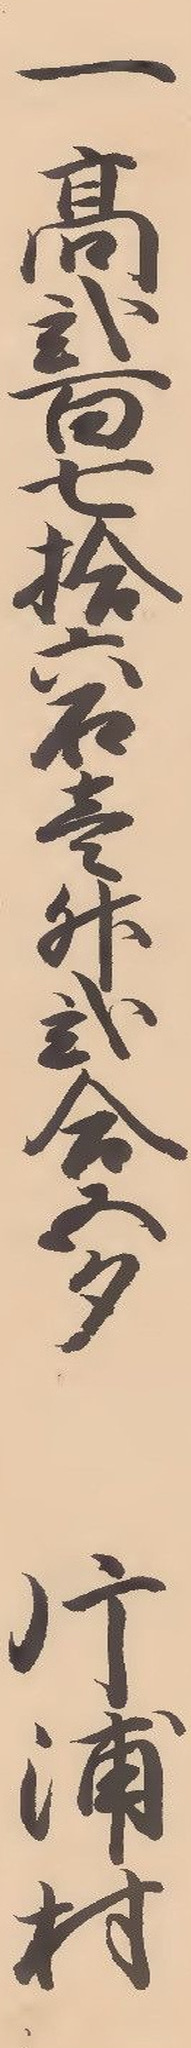一高弐百七拾六石壱升弐合五勺片浦村

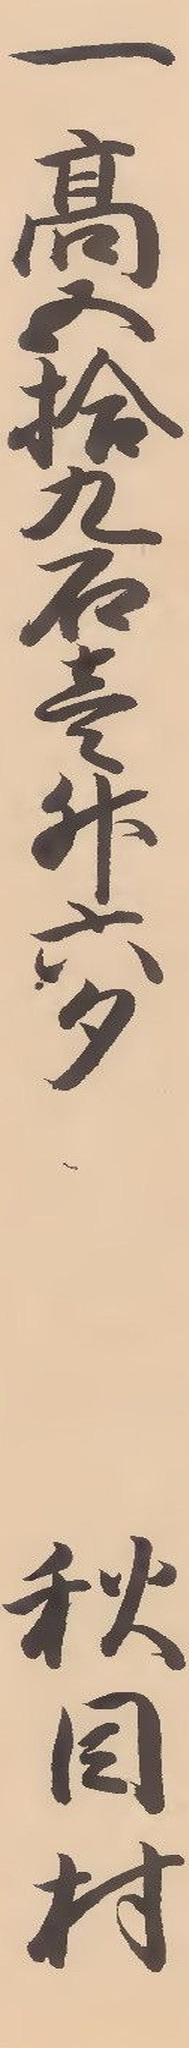一高五拾九石壱升六勺秋目村
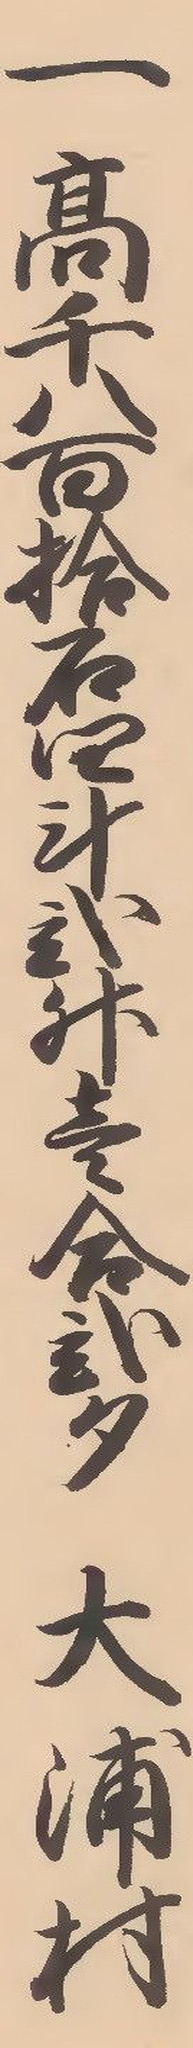一高千八百拾石四斗弐升壱合弐勺大浦村
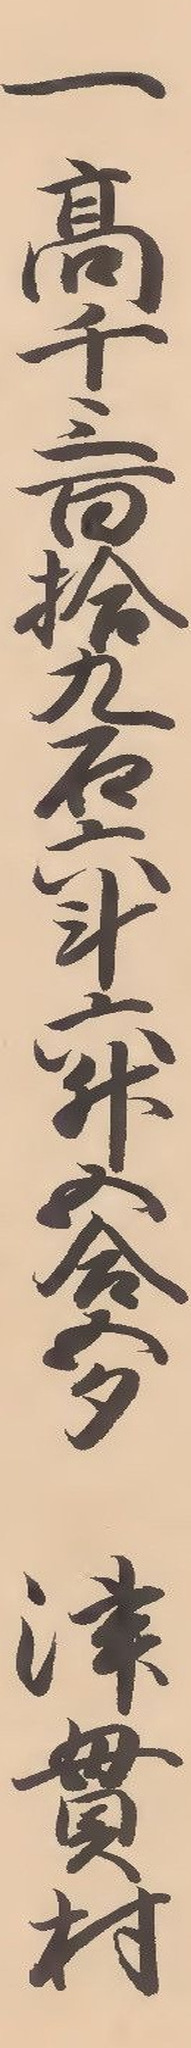一高千三百拾九石六斗六升五合五勺津貫村
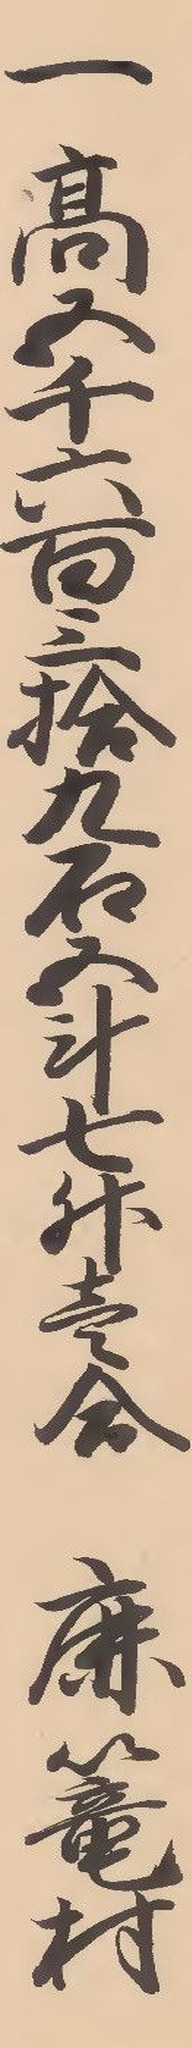一高五千六百三拾九石五斗七升壱合鹿籠村
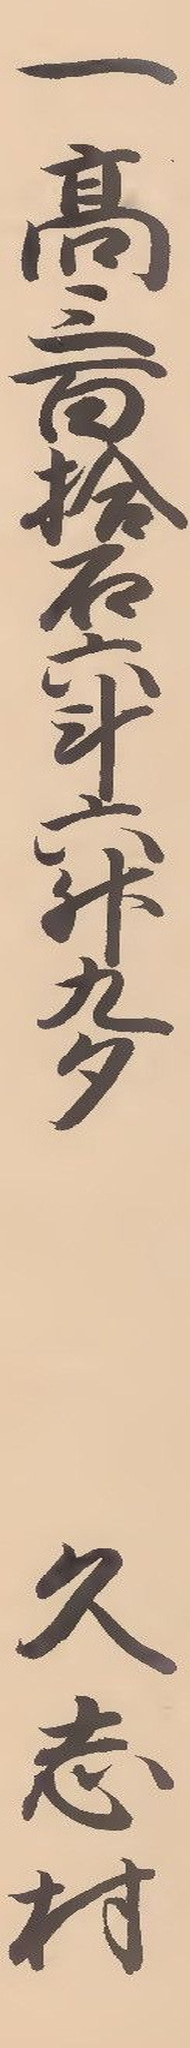一高三百拾石六斗六升九勺久志村
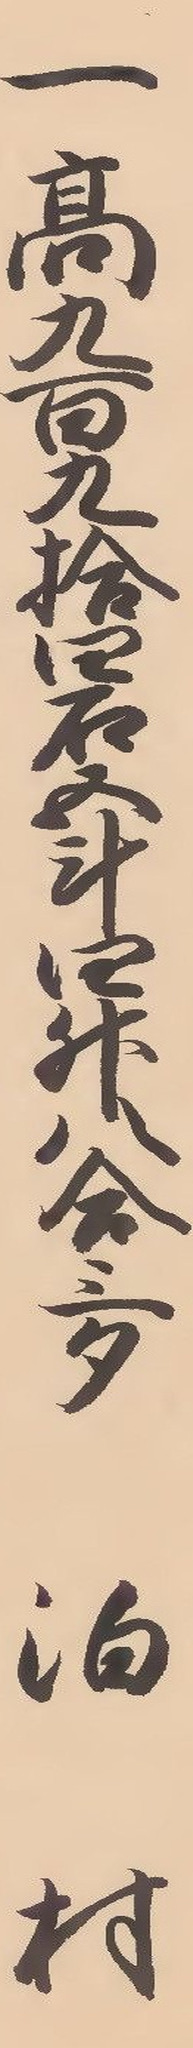一高九百九拾四石五斗四升八合三勺泊村
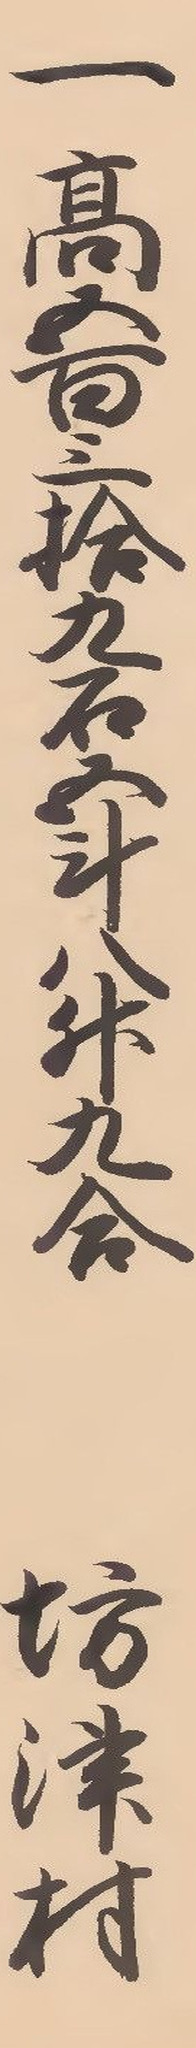一高五百三拾九石五斗八升九合坊津村

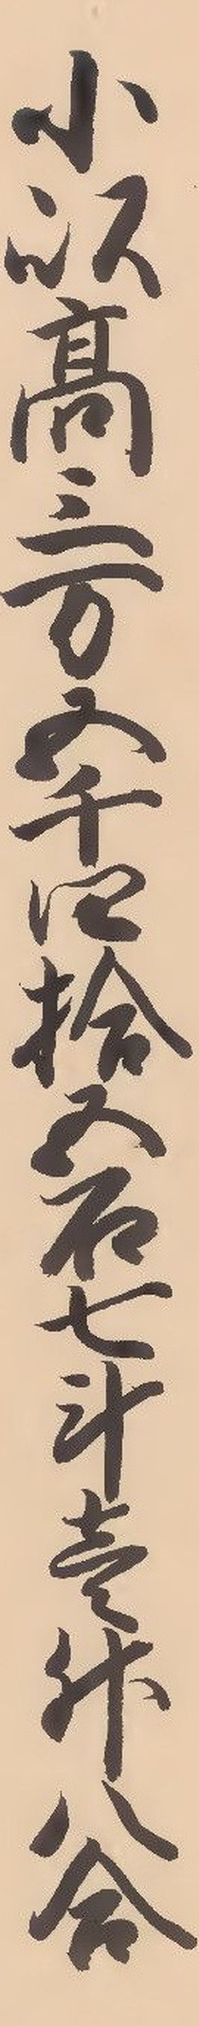小以高三万五千四拾五石七斗壱升八合
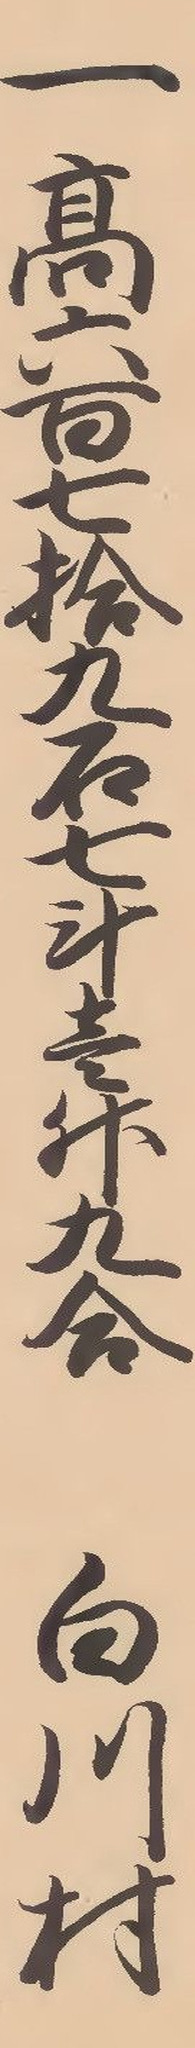一高六百七拾九石七斗壱升九合白川村
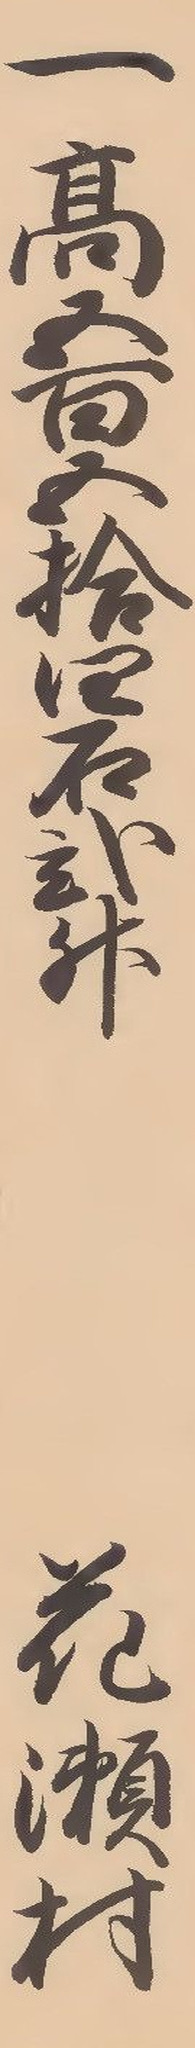一高五百五拾四石弐斗花瀬村
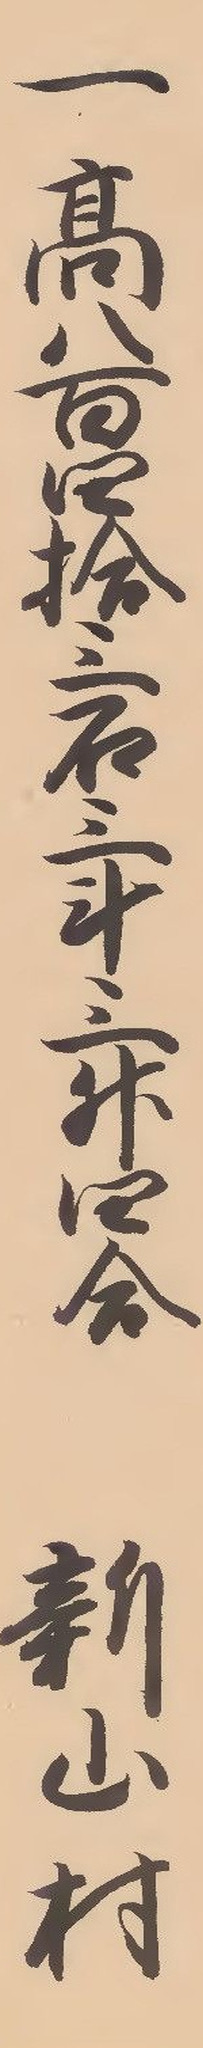一高八百四拾三石三斗三升四合新山村
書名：薩摩国郷帳
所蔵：国立公文書館 National Archives of Japan
